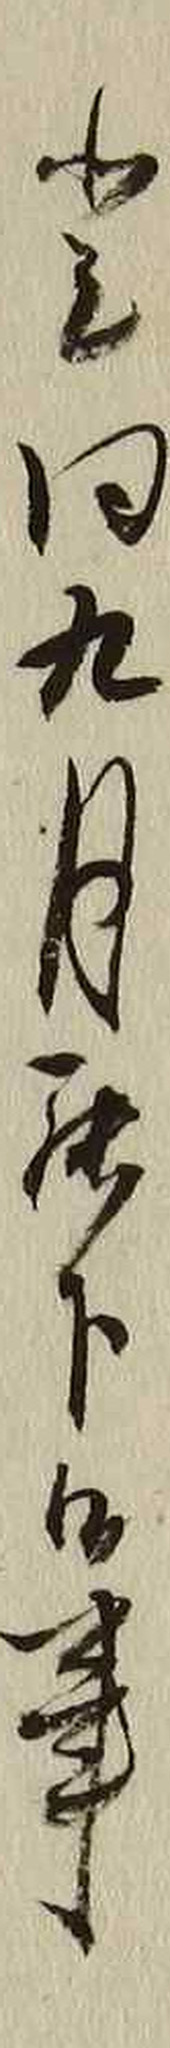登同九月罷下候事
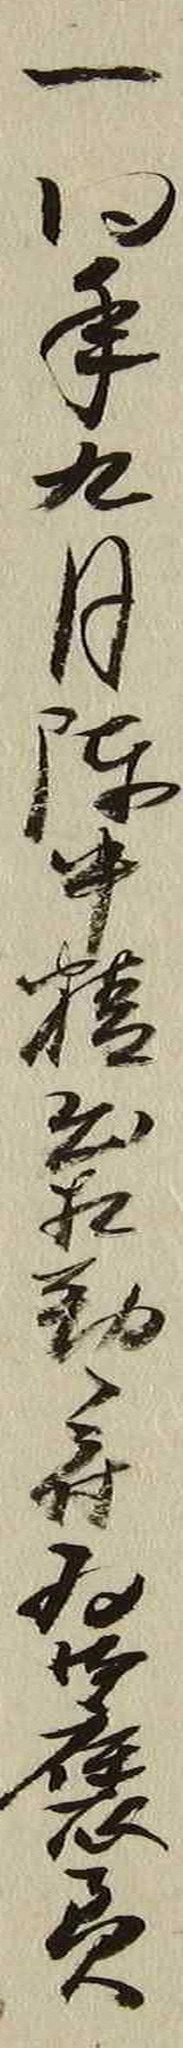一同年九月陣中精出相勤候付為御褒美
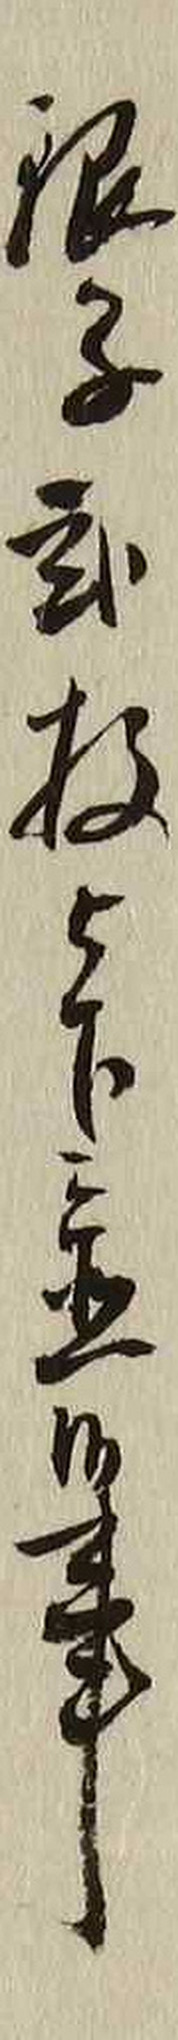銀子弐枚被下置候事
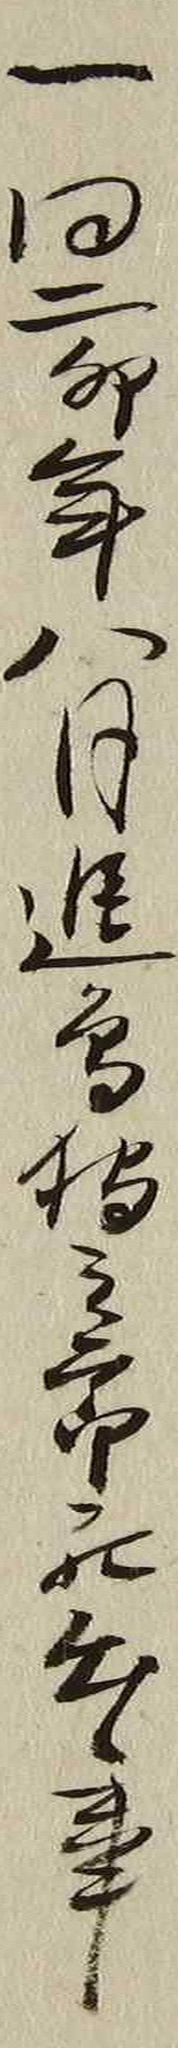一同二卯年八月追鳥狩之節罷出候事
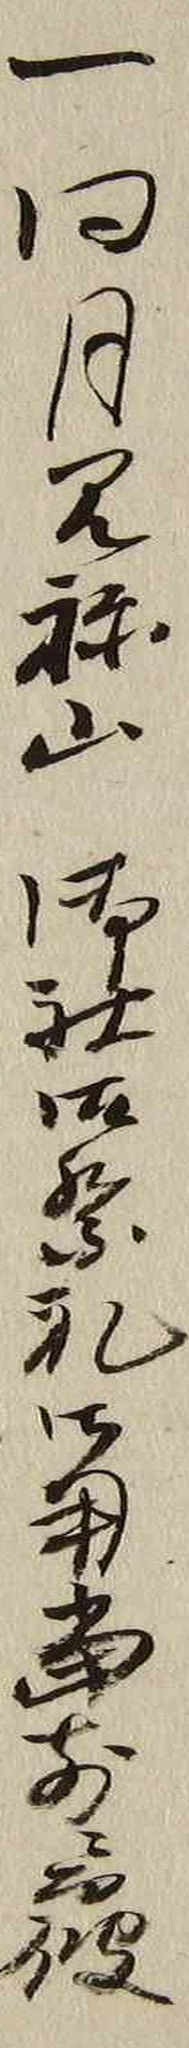一同月見禰山御社御祭礼御用当前而彼
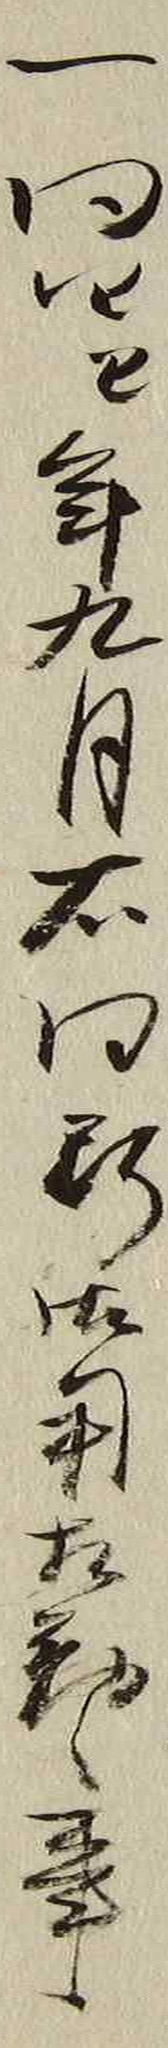一同四巳年九月右同断御用相勤候事
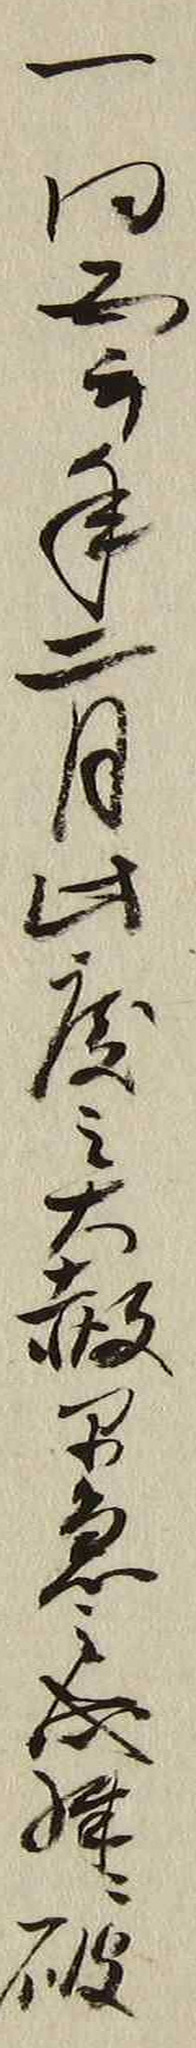一同五午年二月此度之大赦早急之義殊破
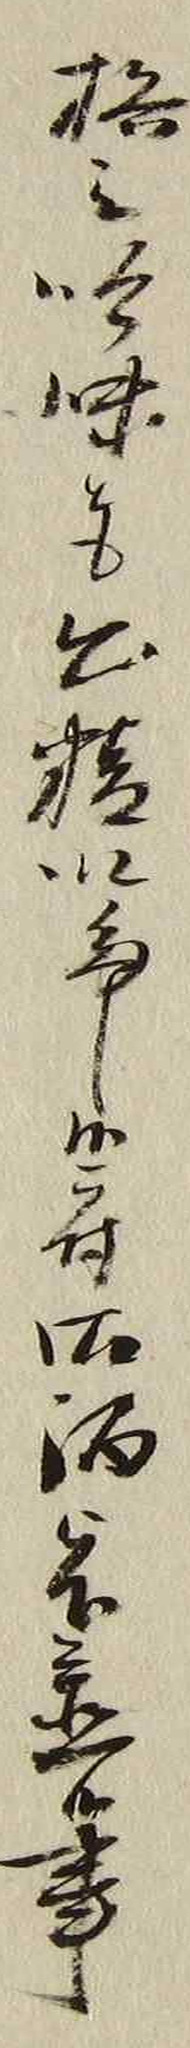格之吟味とも出精いたし候付御酒被下置候事
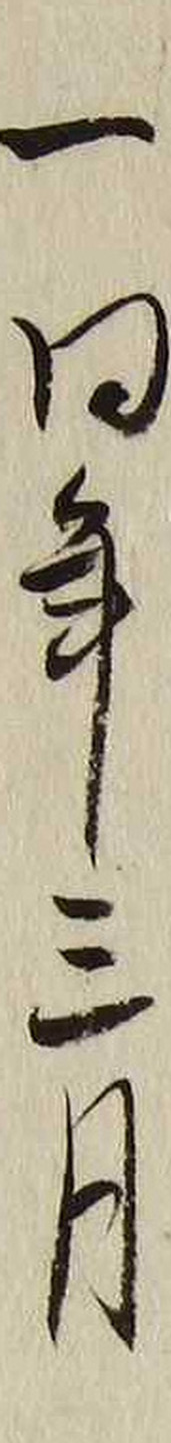一同年三月
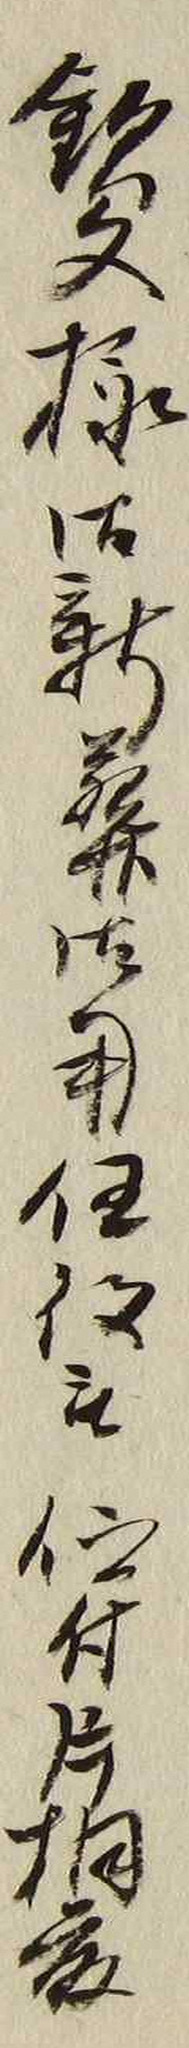欽文様御新葬御用任役被仰付片桐藤
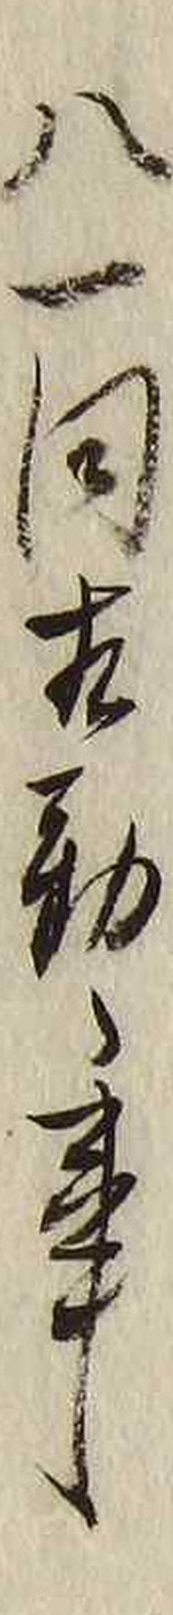八一同相勤候事

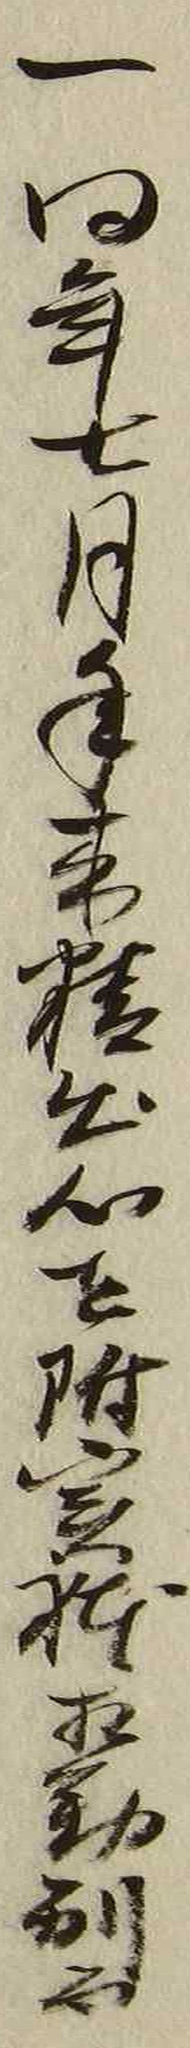一同年七月年来精出心を附実体相勤別而
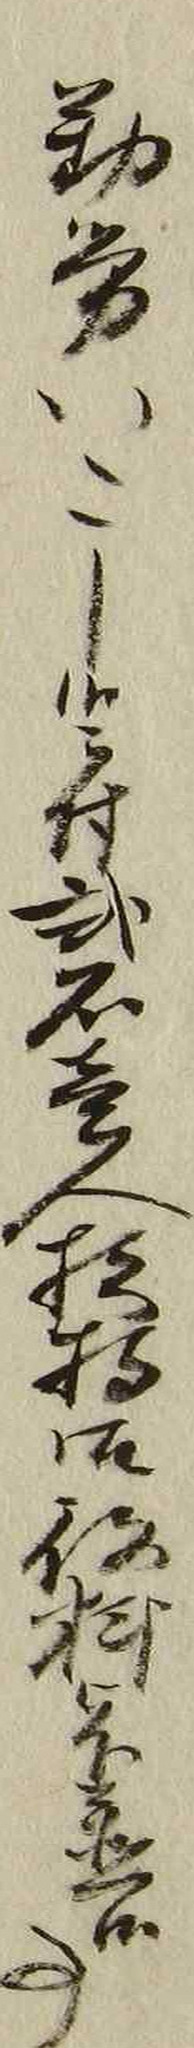勤労いたし候付弐石壱人扶持御役料被下置候事
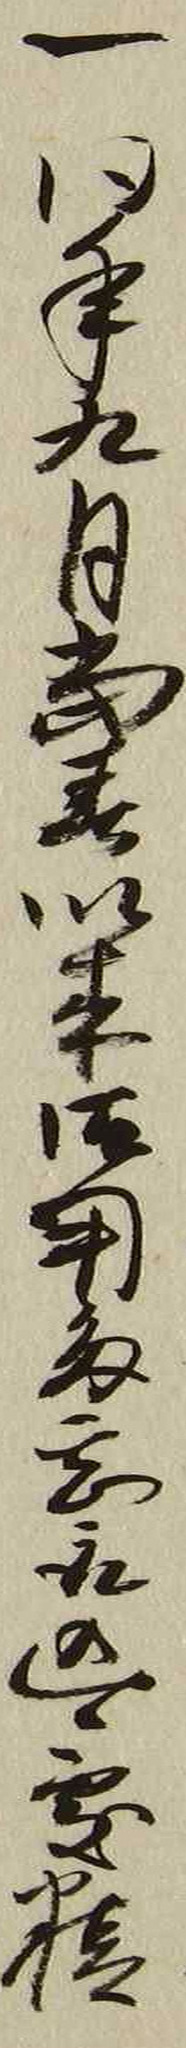一同年九月当春以来御用多甚取込候処精
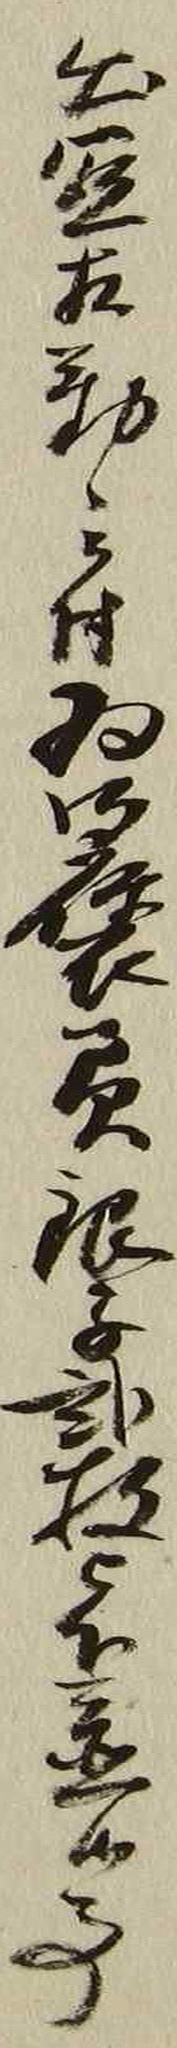出宜相勤候付為御褒美銀子弐枚被下置候事
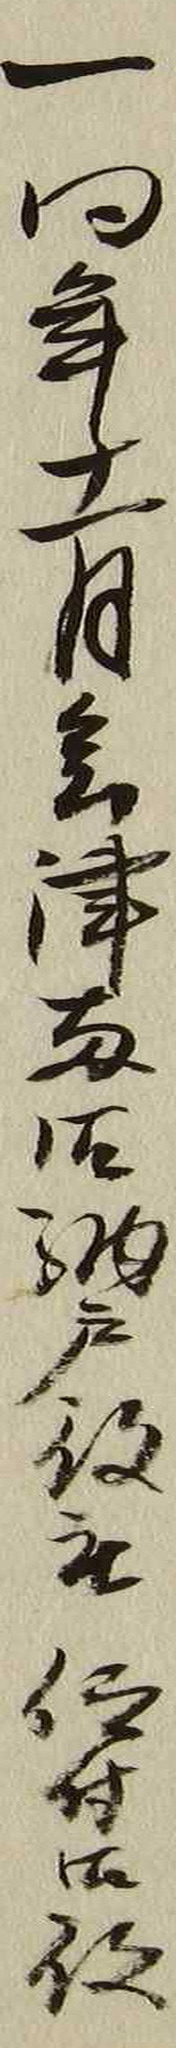一同年十一月会津両御納戸役被仰付御役
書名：諸士系譜　巻之350　せ之部1冊全
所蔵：会津若松市立会津図書館
